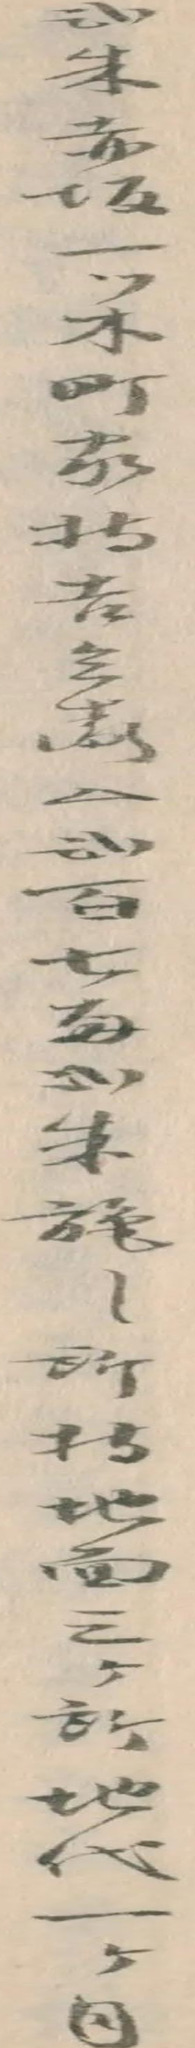弐朱赤坂一ツ木町家持吉兵衛△弐百七両弐朱施し所持地面三ヶ所地代一ヶ月
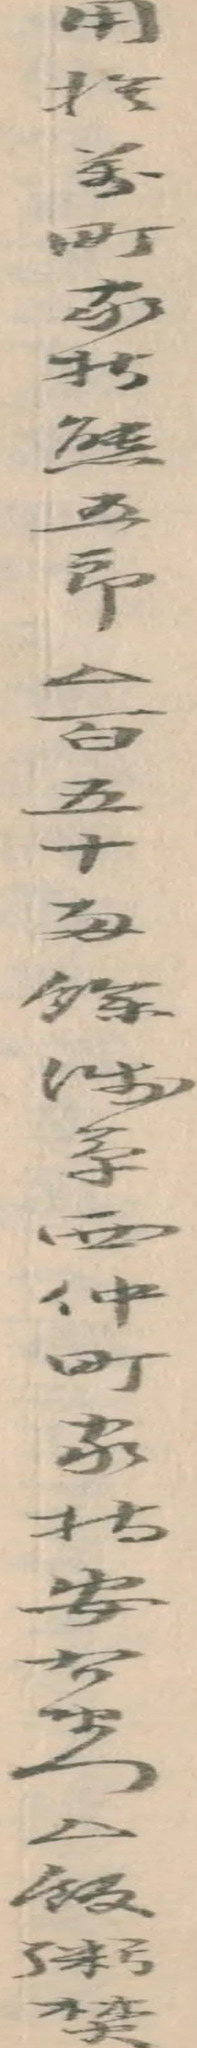用捨万町家持熊五郎△百五十両余浅草西仲町家持安右衛門△飯粥焚

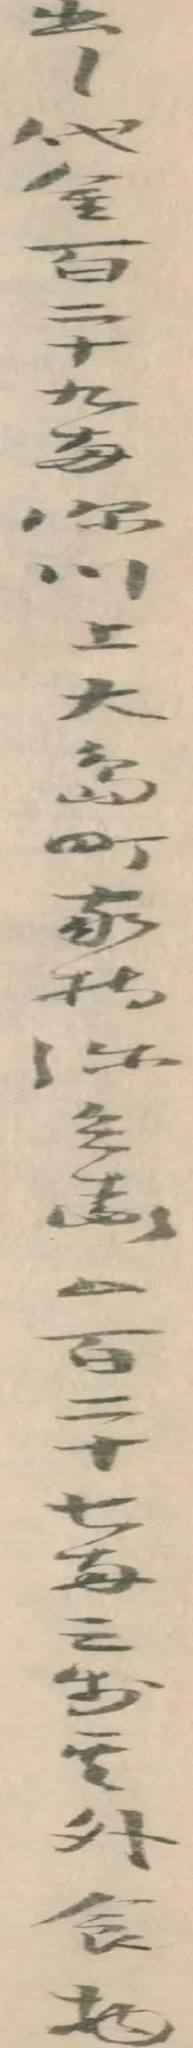出し代金百二十九両深川上大島町家持弥兵衛△百二十七両三歩其外食物
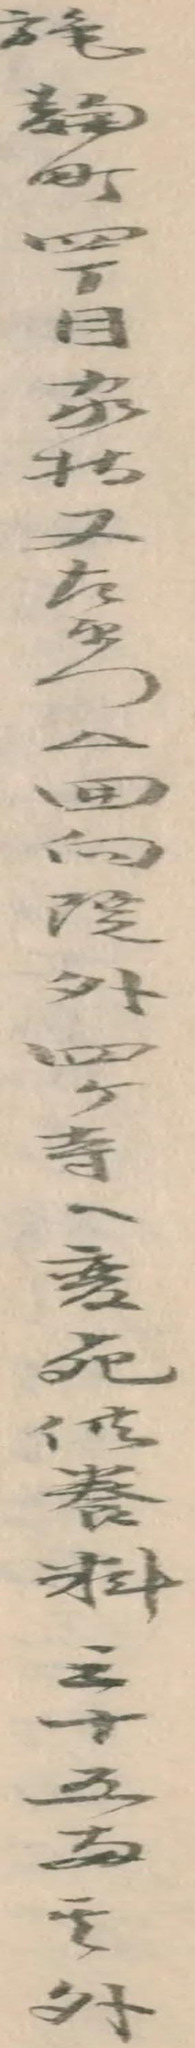施麹町四丁目家持又左衛門△回向院外四ヶ寺へ変死供養料三十五両其外
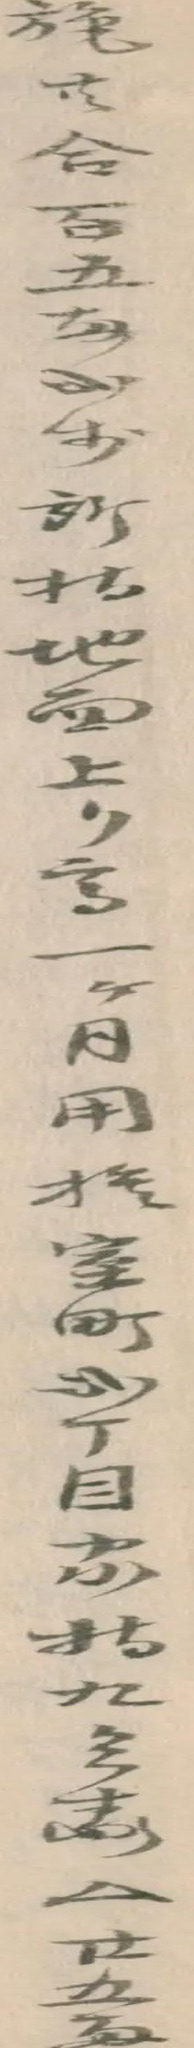施共合百五両弐歩所持地面上り高一ケ月用捨室町弐丁目家持九兵衛△廿五両
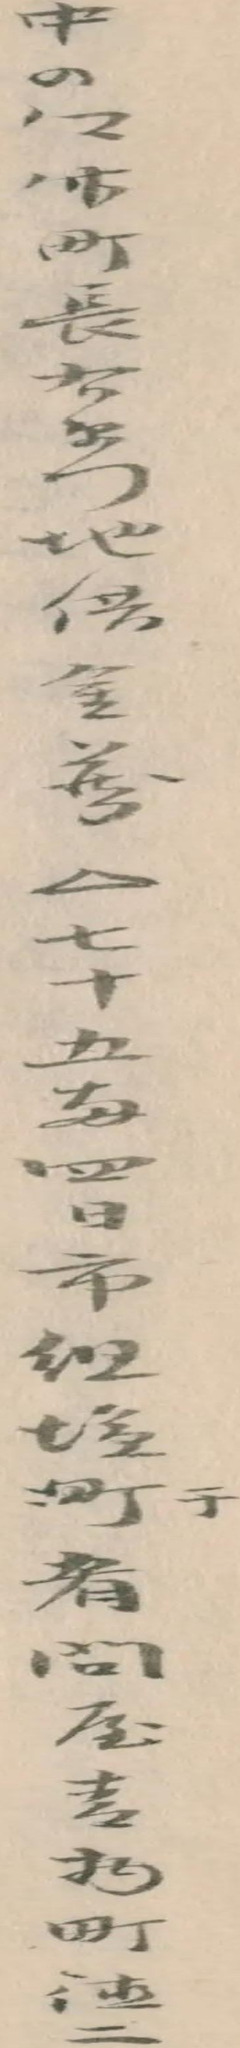中の郷竹町長右衛門地借金蔵△七十五両四日市組塩町肴問屋青物町徳二
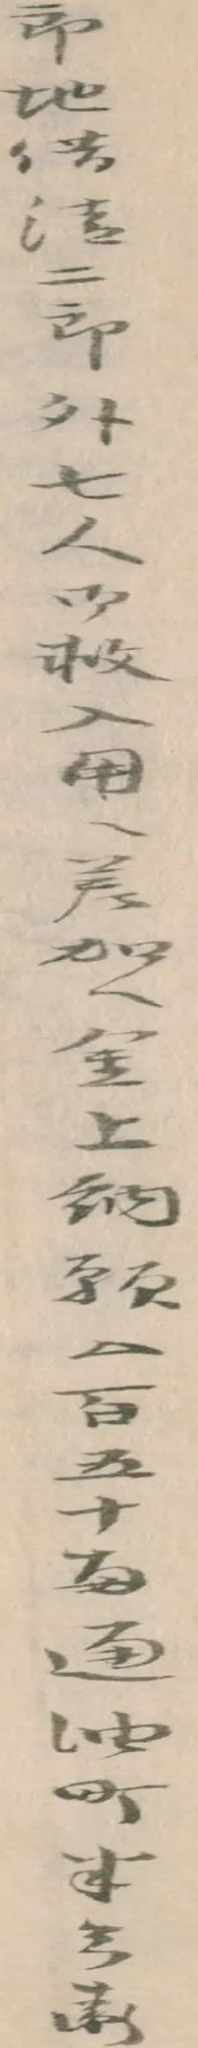郎地借清二郎外七人御救入用へ差加へ金上納願△百五十両通油町半兵衛
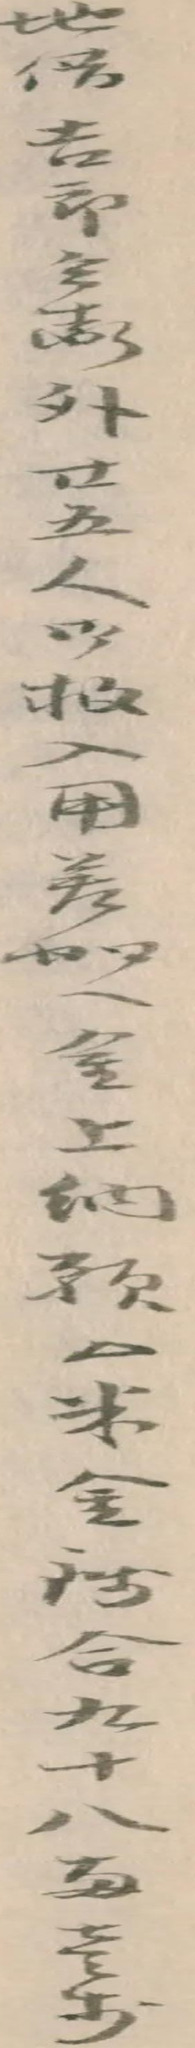地借吉郎兵衛外廿五人御救入用差加へ金上納願△米金銭合九十八両壱歩
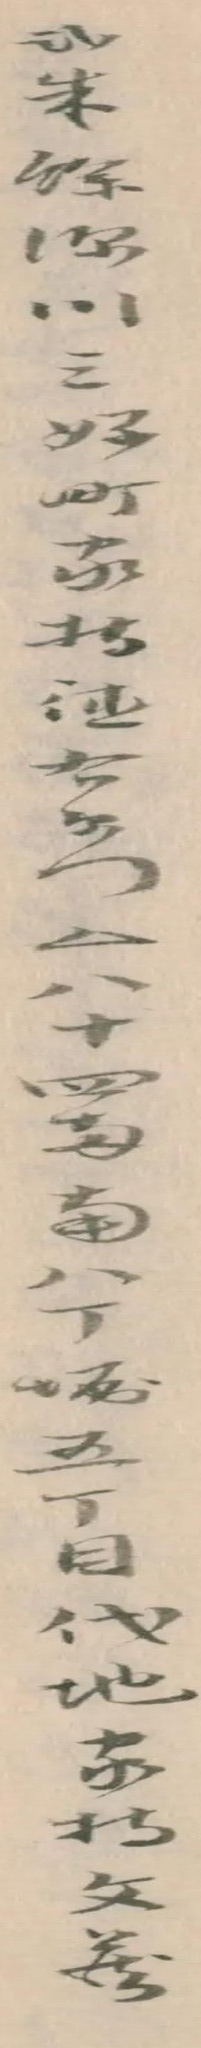弐朱余深川三好町家持徳右衛門△八十四両南八丁堀五丁目代地家持文蔵
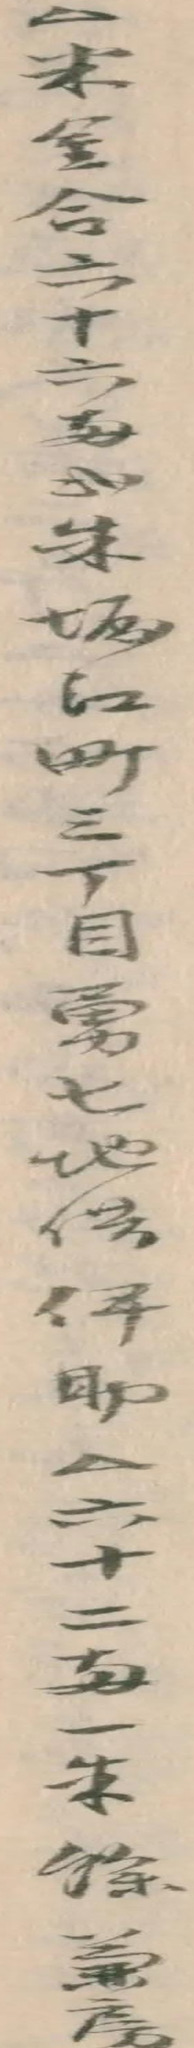△米金合六十六両弐朱堀江町三丁目勇七地借伊助△六十二両一朱余兼房
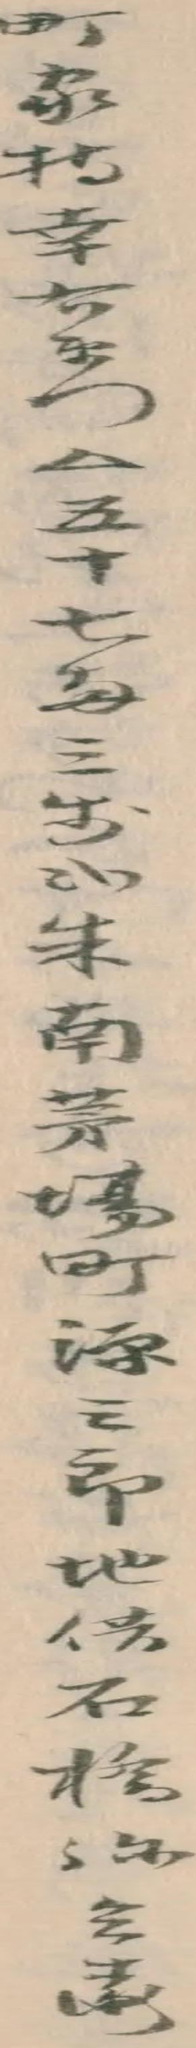町家持幸右衛門△五十七両三歩弐朱南茅場町源三郎地借石橋弥兵衛
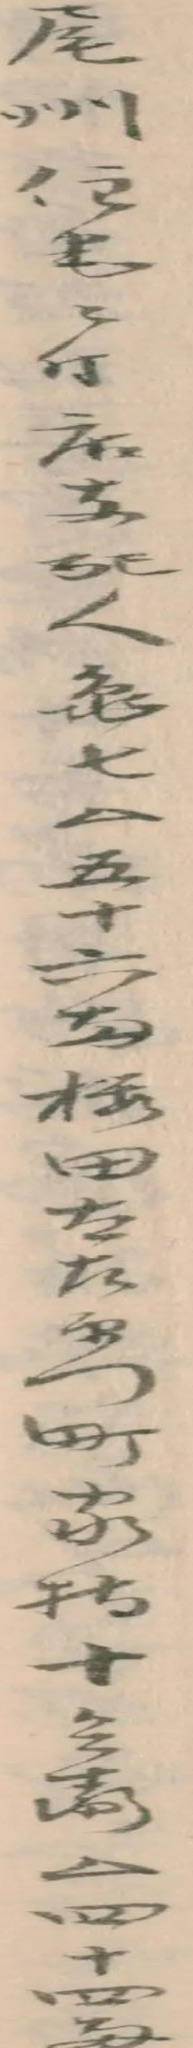尾州住宅付店支配人亀七△五十六両桜田太左衛門町家持十兵衛△四十四両
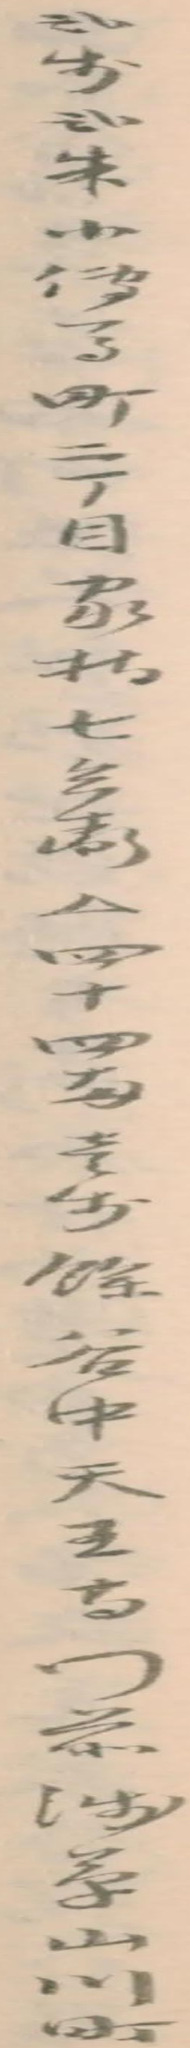弐歩弐朱小伝馬町二丁目家持七兵衛△四十四両壱歩余谷中天王寺門前浅草山川町
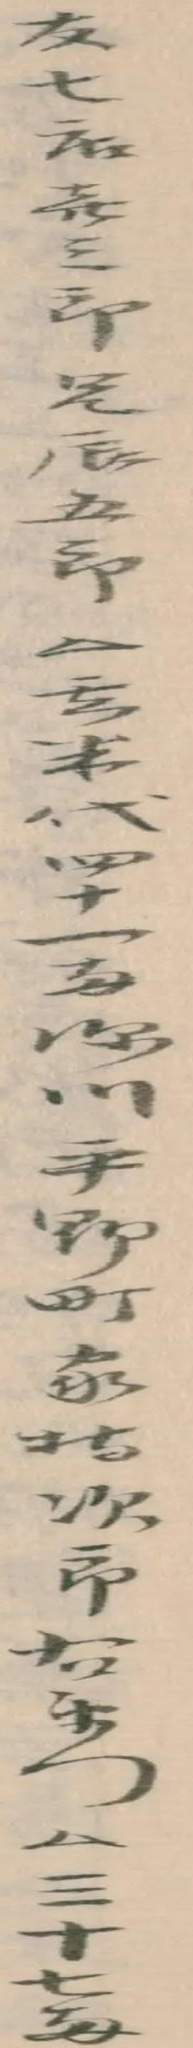友七店喜三郎兄辰五郎△玄米代四十一両深川平野町家持次郎右衛門△三十七両
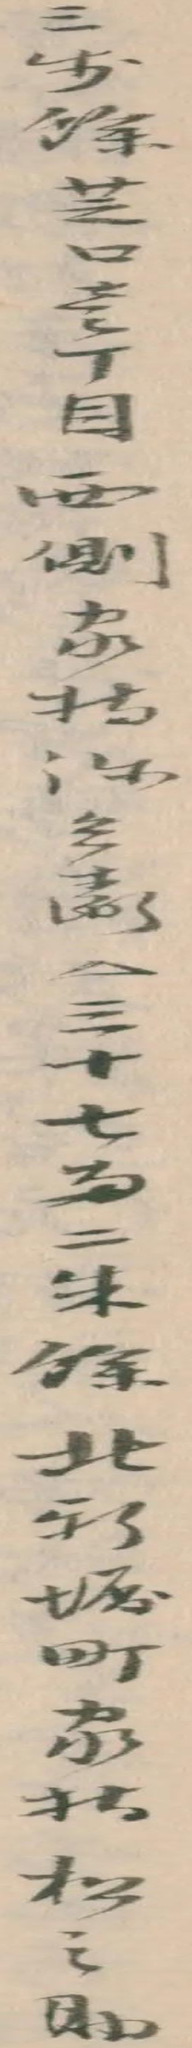三歩余芝口壱丁目西側家持弥兵衛△三十七両二朱余北新堀町家持松之助
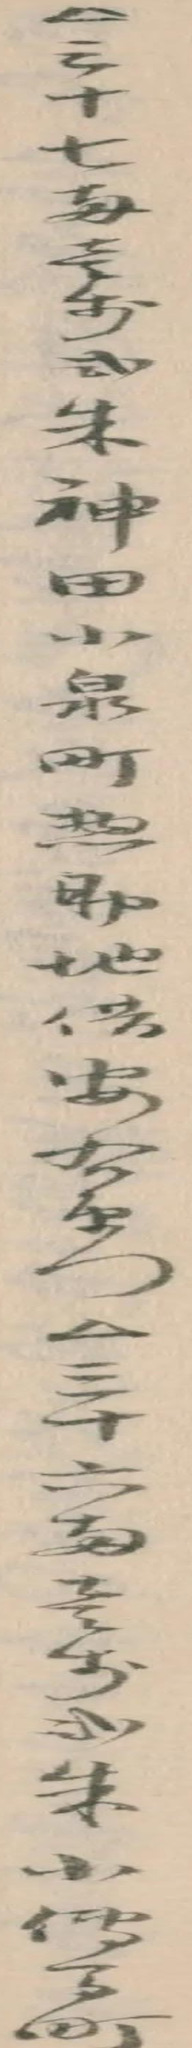△三十七両壱歩弐朱神田小泉町惣助地借安右衛門△三十六両壱歩弐朱小伝馬町
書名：地災撮要. 巻10(地震之部) 上,下
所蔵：国立国会図書館 National Diet Library, JAPAN
